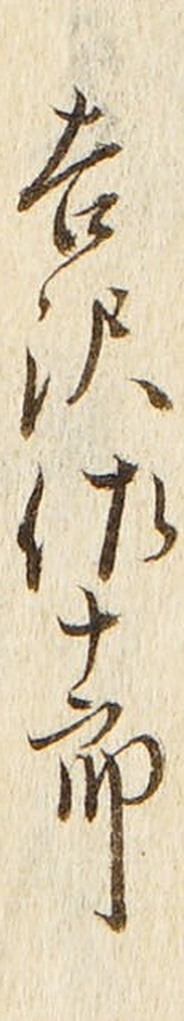吉沢佐十郎
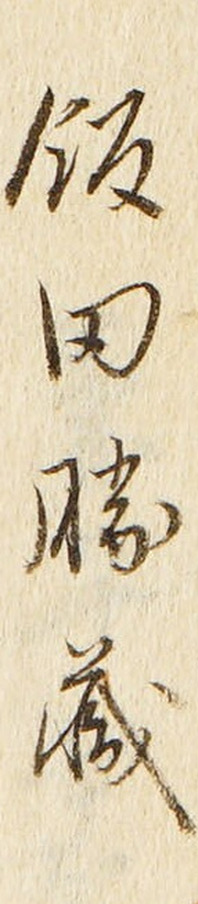飯田勝蔵
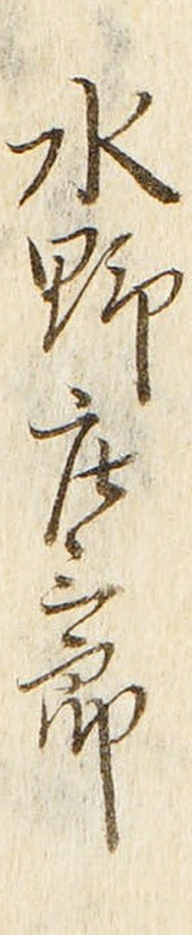水野庄三郎
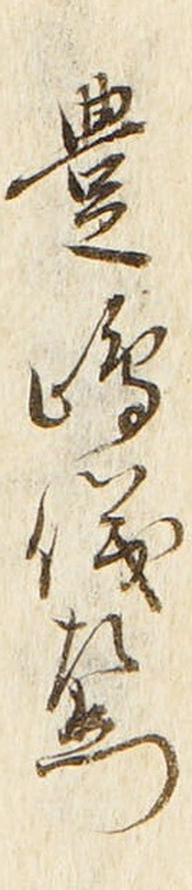豊島儀左衛門
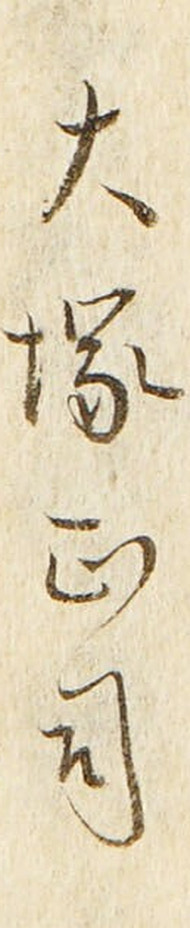大塚正司
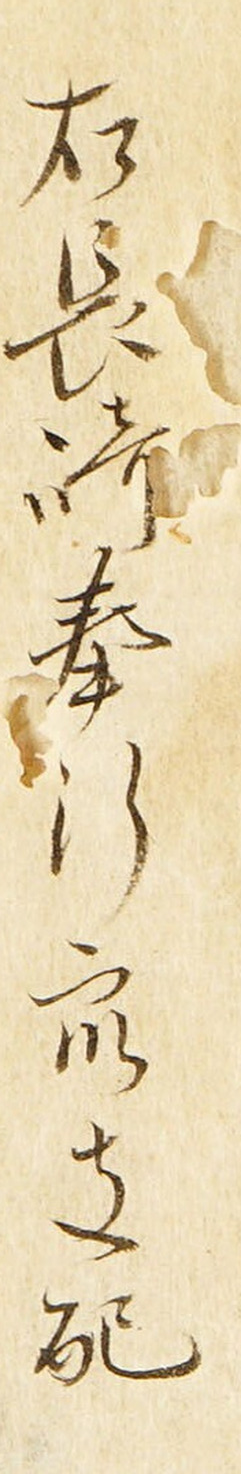右長崎奉行衆支配
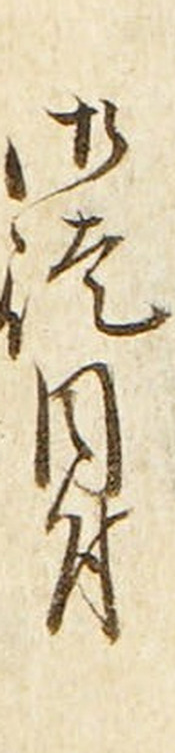御徒目付
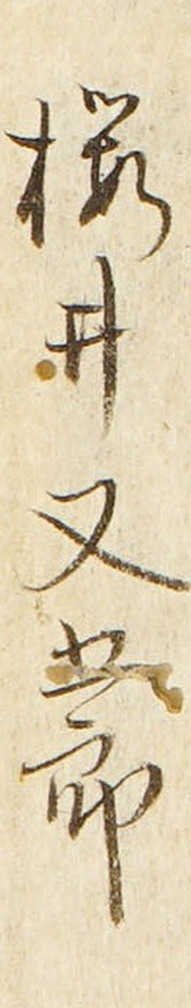桜井又五郎

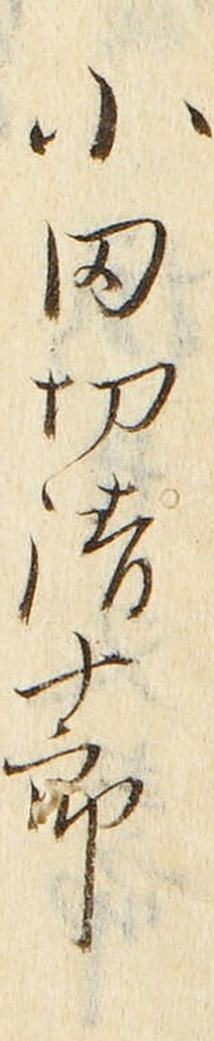小田切清十郎
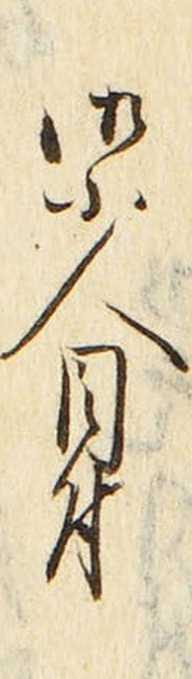御小人目付
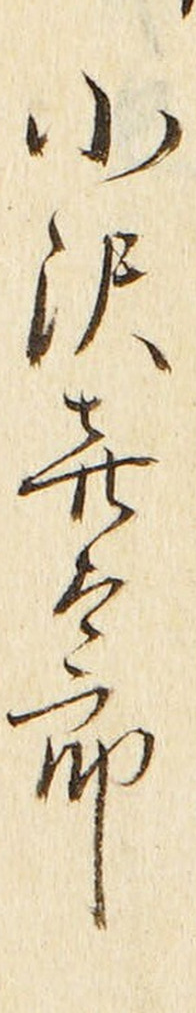小沢喜太郎
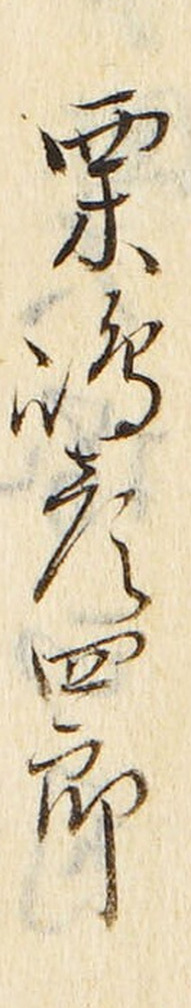栗嶋彦四郎
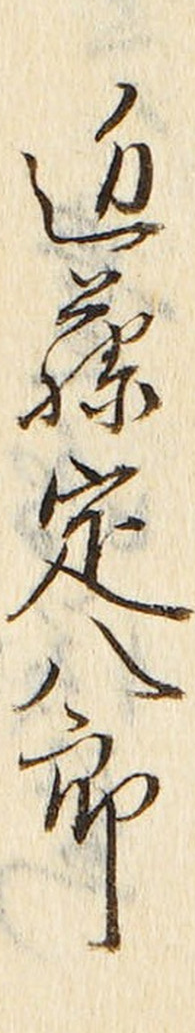近藤定八郎
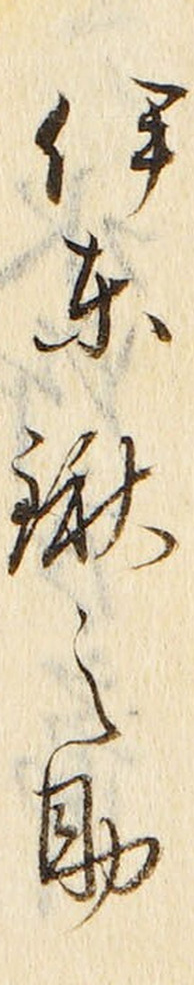伊藤鍬之助
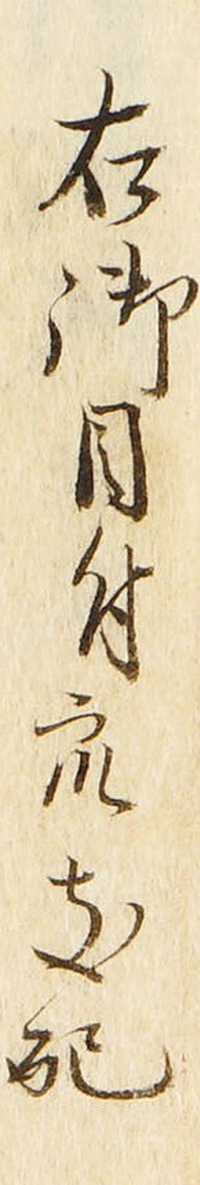右御目付衆支配
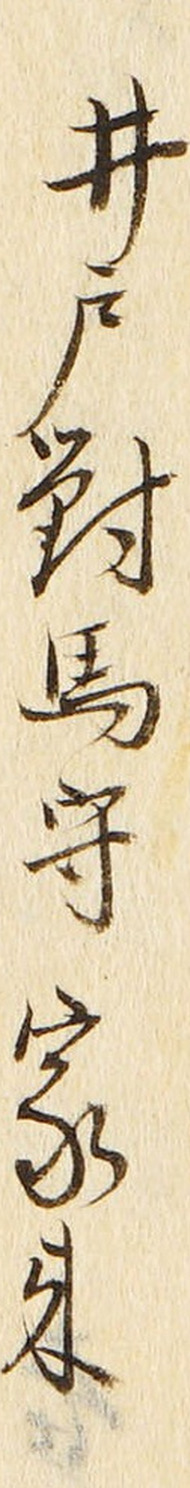井戸対馬守家来
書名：長崎漂流記
